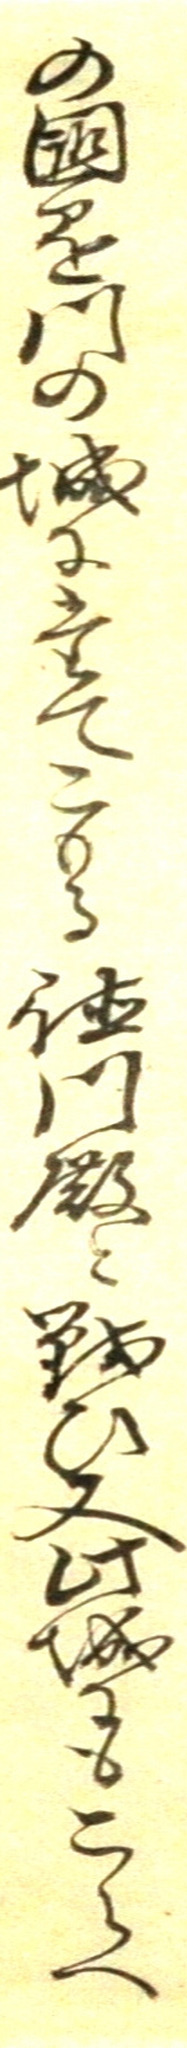の国懸川の城にたてこもる徳川殿と戦ひ又此城にもこらへ
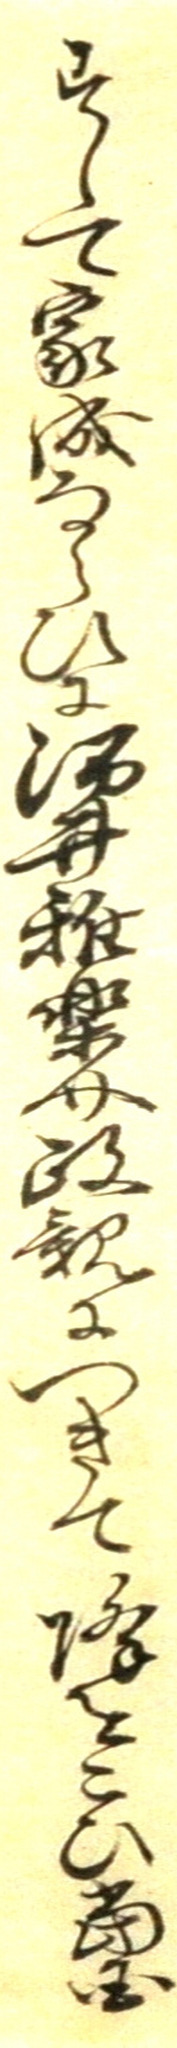すして家成ならひに酒井雅楽介政親につきて降をこひ当国
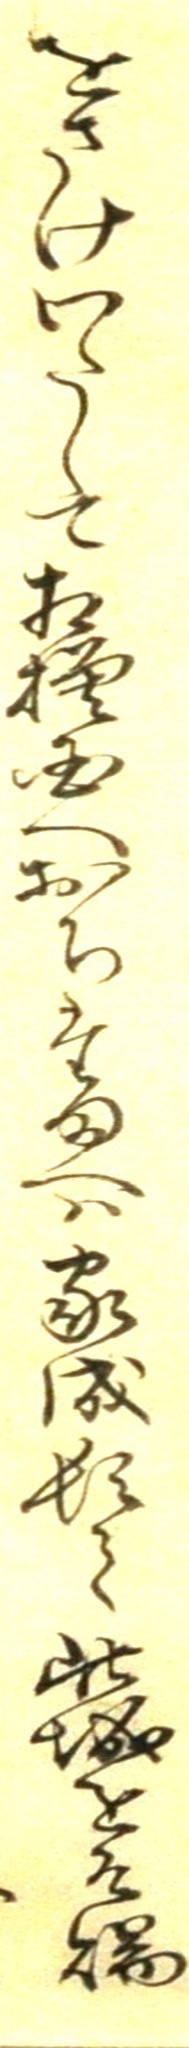をさけわたして相模国へおちたまへは家成頓て此城をそ賜

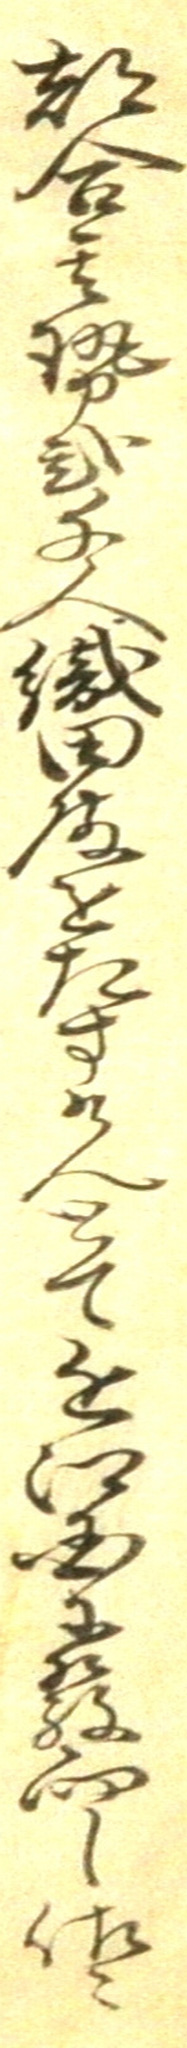都合其勢弐千人織田殿をたすけんとて近江国に発向し佐々
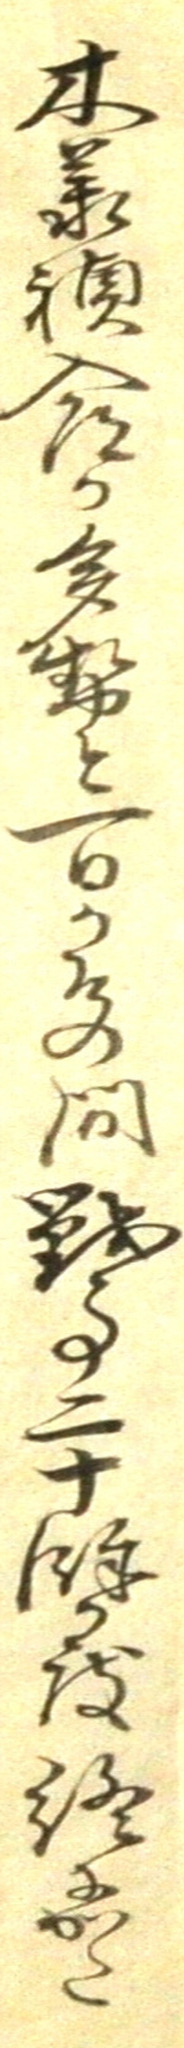木承禎入道か多勢と一日かその間戦事二十余か度終にかた
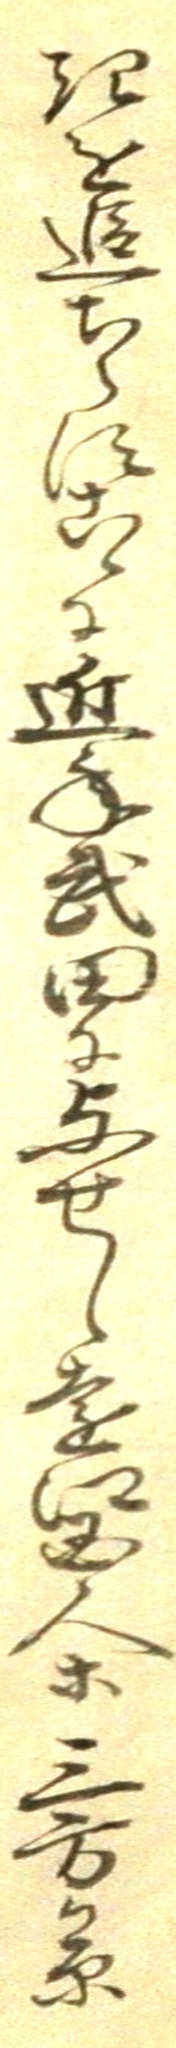きを追ちらすこゝに近年武田に与せし遠江国人等三方か原
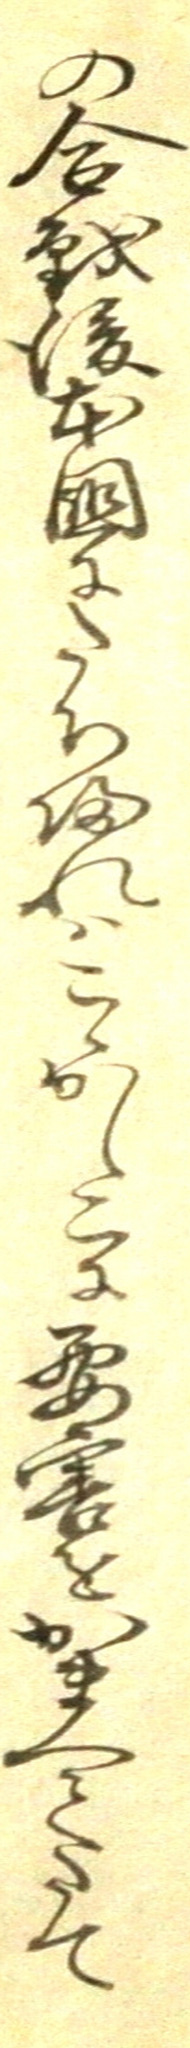の合戦後本国にたち帰れはこゝかしこに要害をかまへてたて
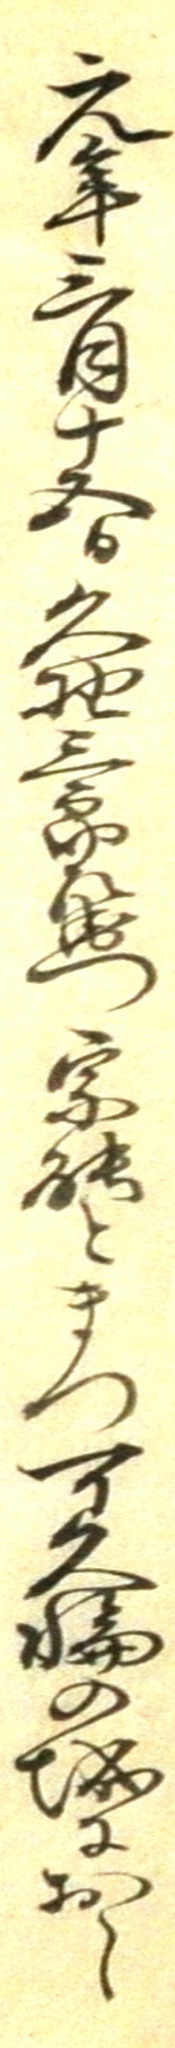元年三月十五日久野三郎左衛門宗能とまつ可久輪の城におし
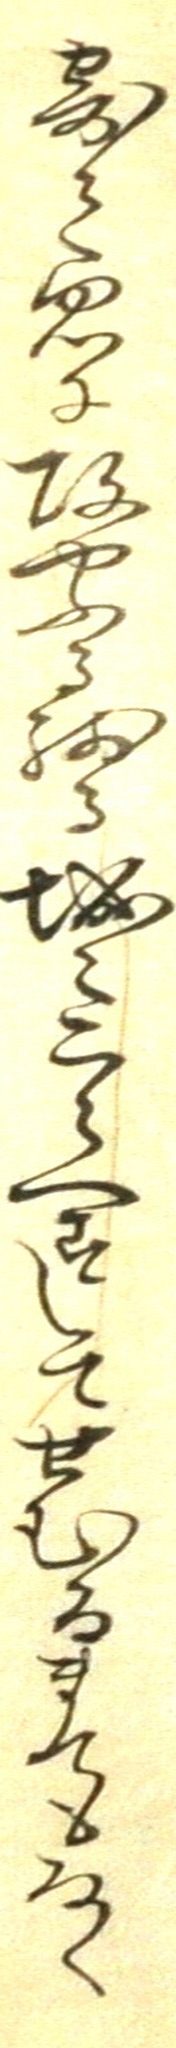寄て忽に攻やふる残る城々こらへすしてせむるまてもなく
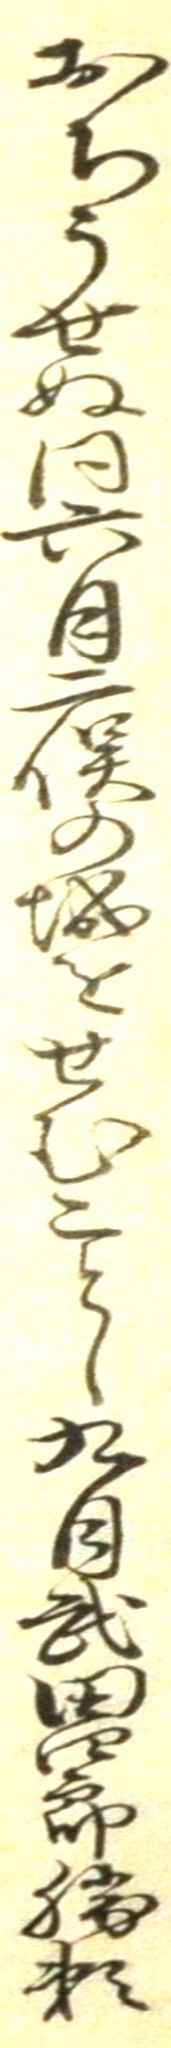おちうせぬ同六月二俣の城をせむことし九月武田四郎勝頼
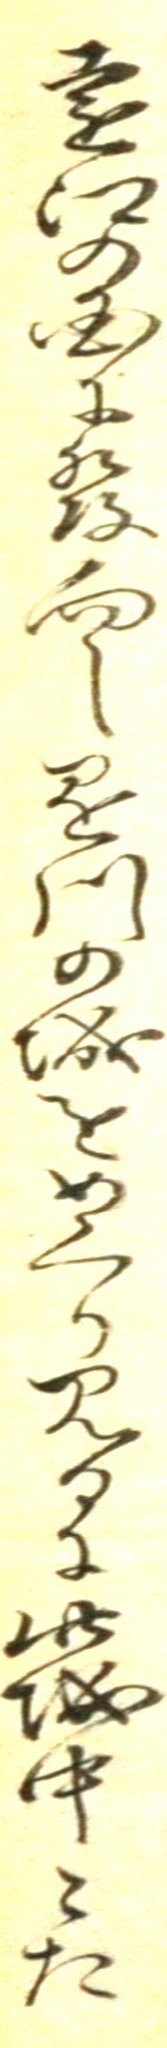遠江の国に発向し懸川の城をめくり見るに此城中々た
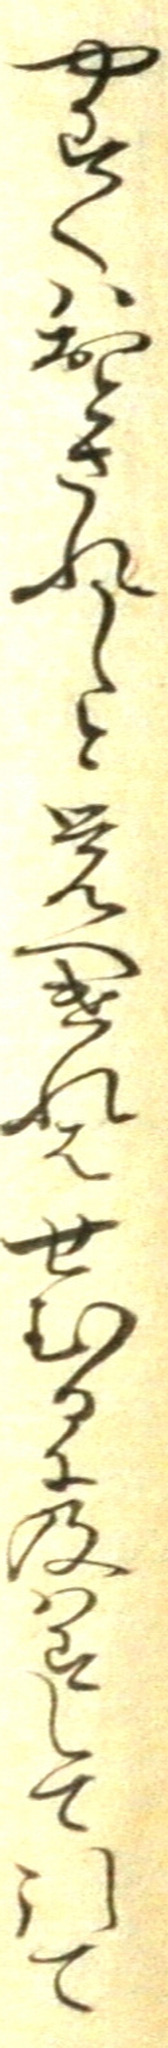やすくはおとされしと覚へけれはせむるに及はすして引て
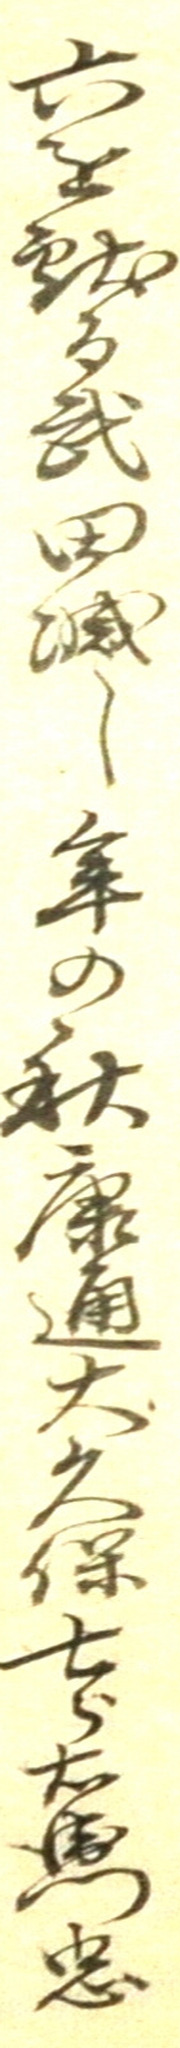六を献る武田滅し年の秋康通大久保七郎右衛門忠
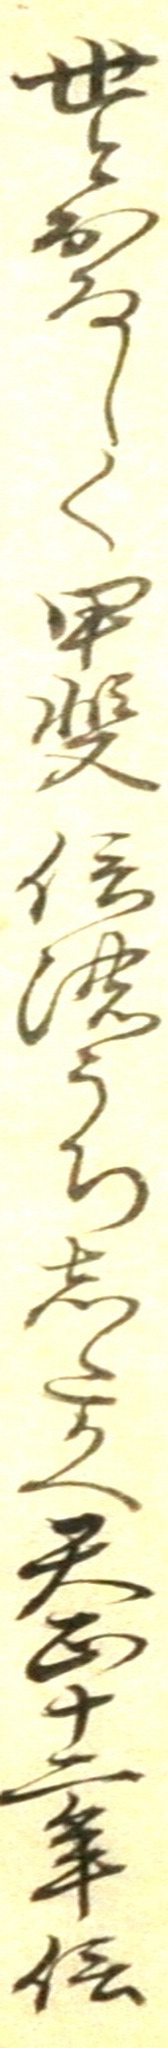世とおなしく甲斐信濃うちしたかへ天正十二年信
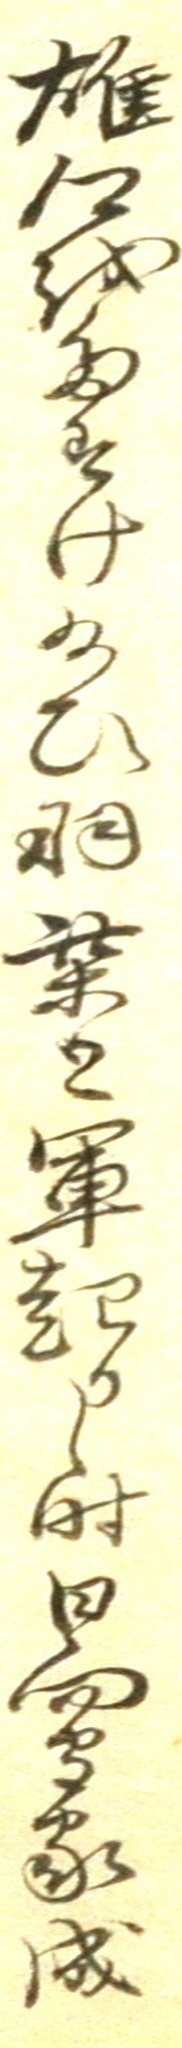雄卿をたすけ給ひ羽柴と軍起りし時日向守家成
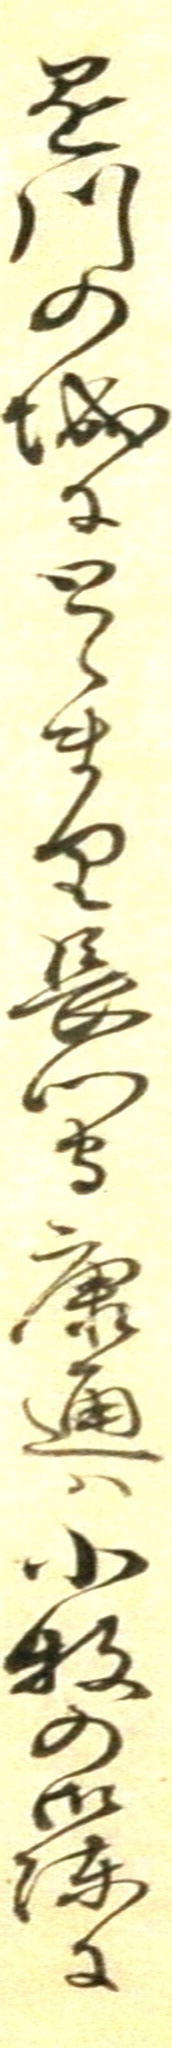懸川の城にとゝまり長門守康通は小牧の陣に
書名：藩翰譜（四・中）
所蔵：伊那市立高遠町図書館・合同会社AMANE
